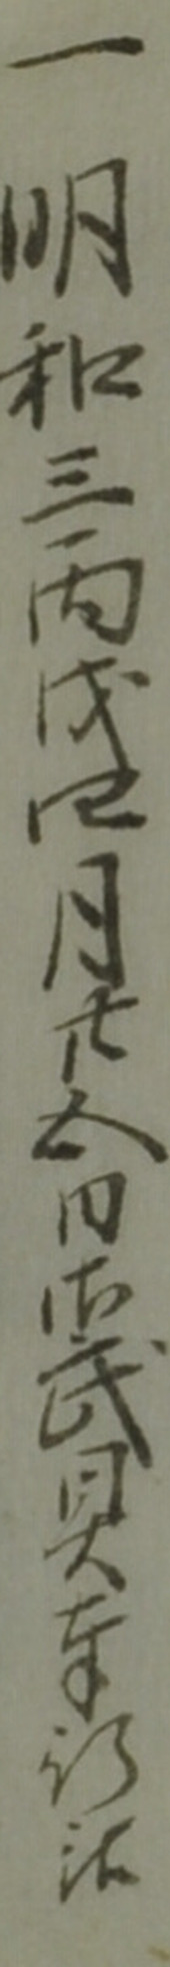一明和三丙戊四月廿五日御武具奉行被
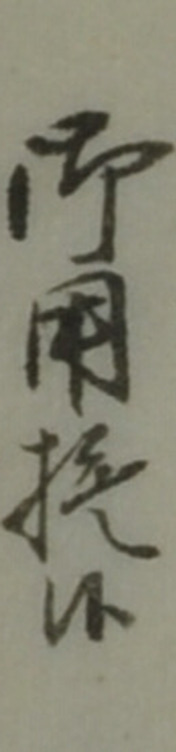御用捨候
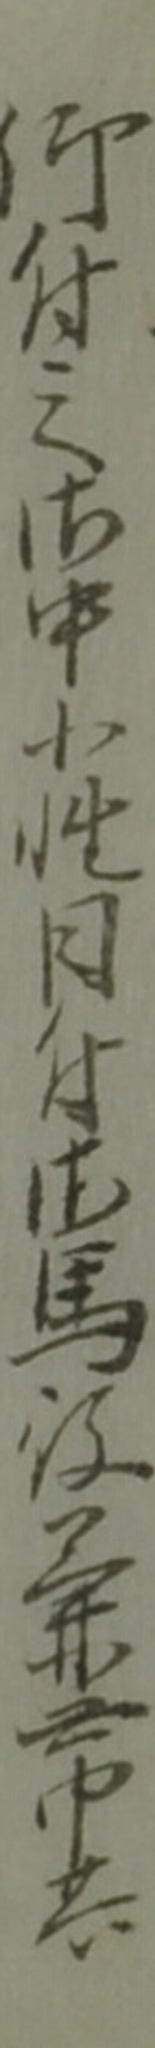仰付之御中小姓目付御馬役兼帯共
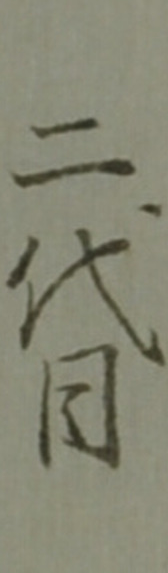二代目
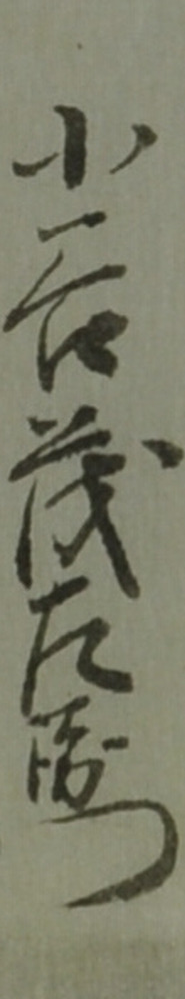小谷茂左衛門
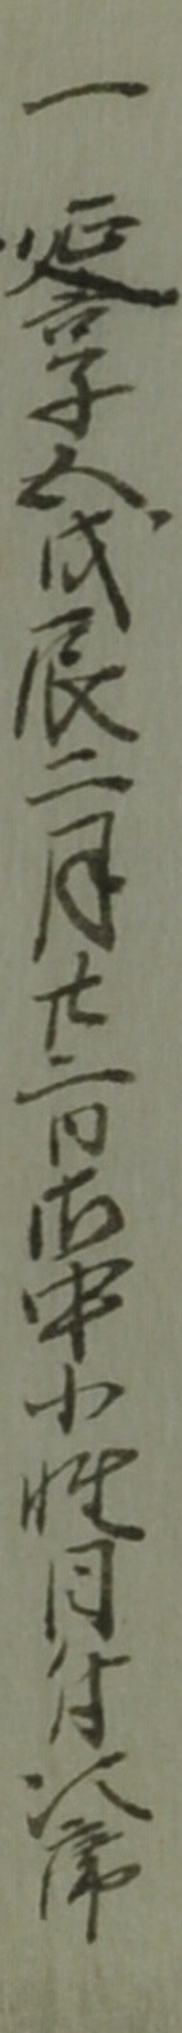一延享五戊辰二月廿二日御中小姓目付次席
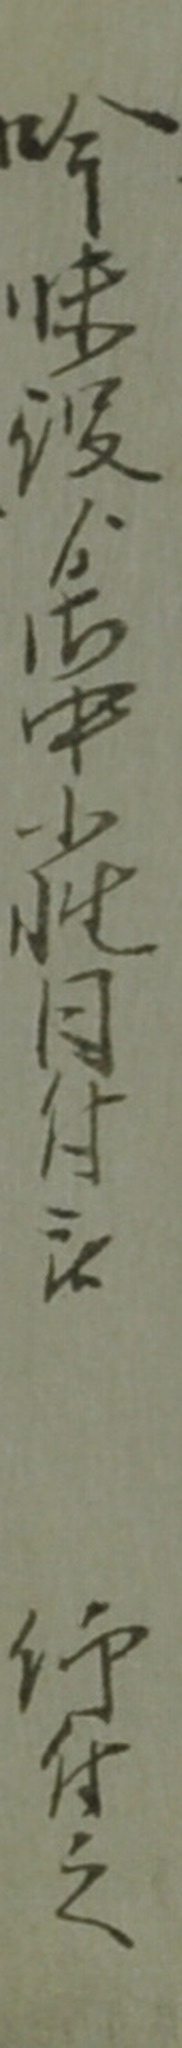吟味役より御中小姓目付被仰付之
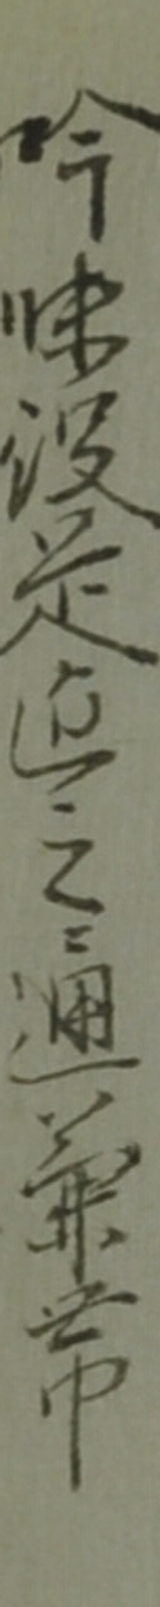吟味役是迄之通兼帯
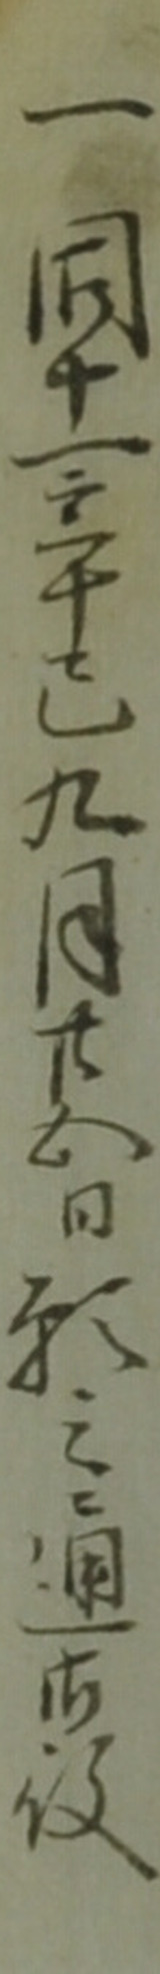一同十一辛巳九月廿五日願之通御役
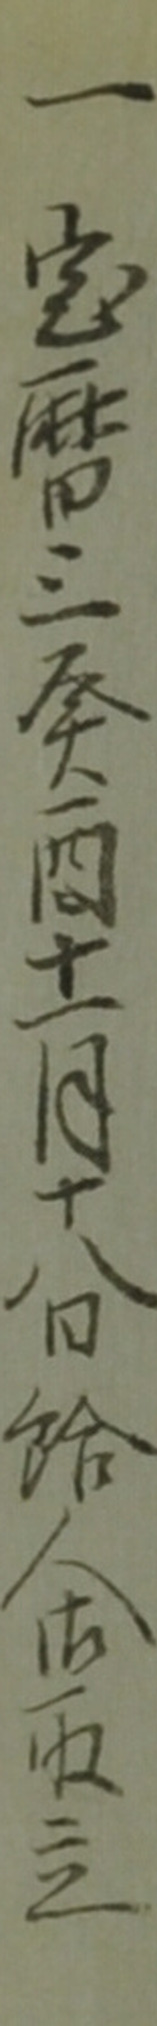一宝暦三癸酉十一月十八日給人御取立

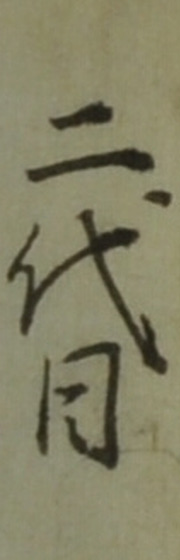二代目
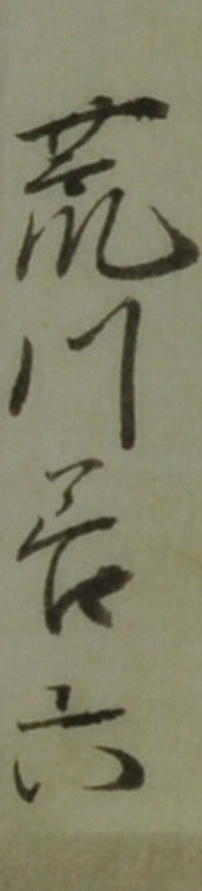荒川善六
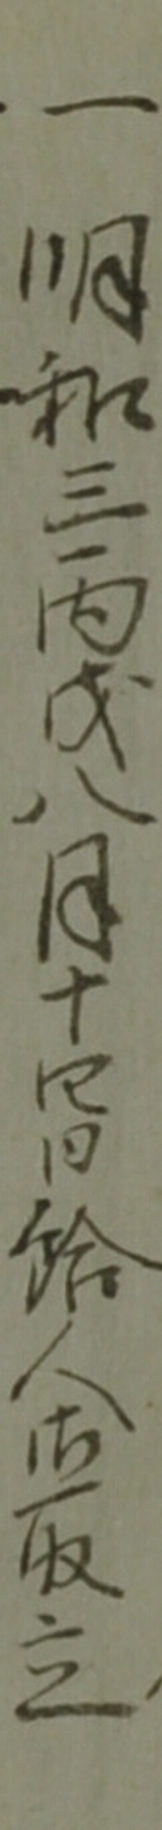一明和三丙戌八月十四日給人御取立
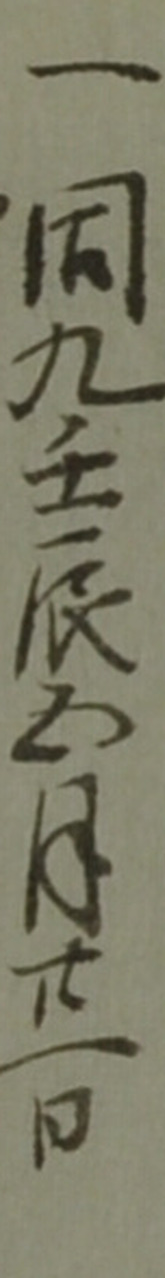一同九壬辰五月廿一日
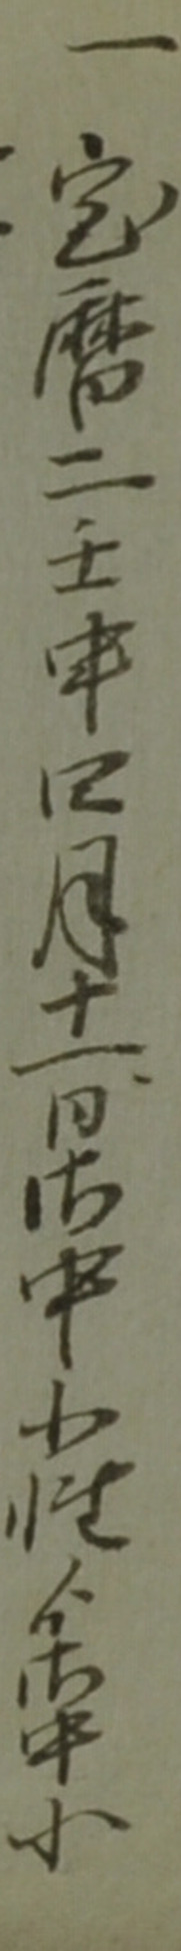一宝暦二壬申四月十一日御中小性より御中小
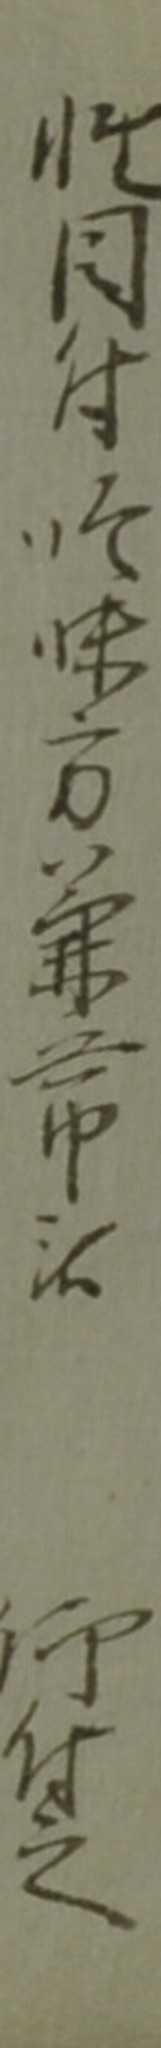性目付吟味方兼帯被仰付之
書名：諸御役代々録（八）
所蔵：伊那市立高遠町図書館・合同会社AMANE
